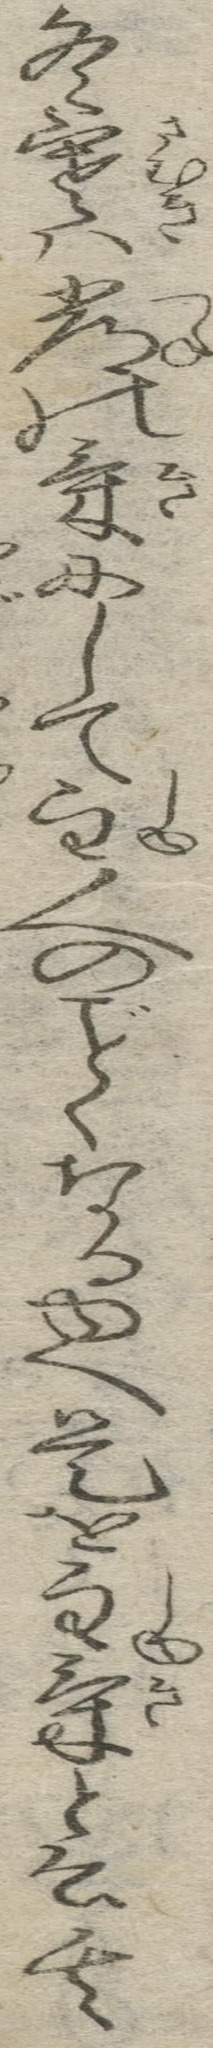冬寒は常の気にして主人のごとくなるゆへ是を主気と云其
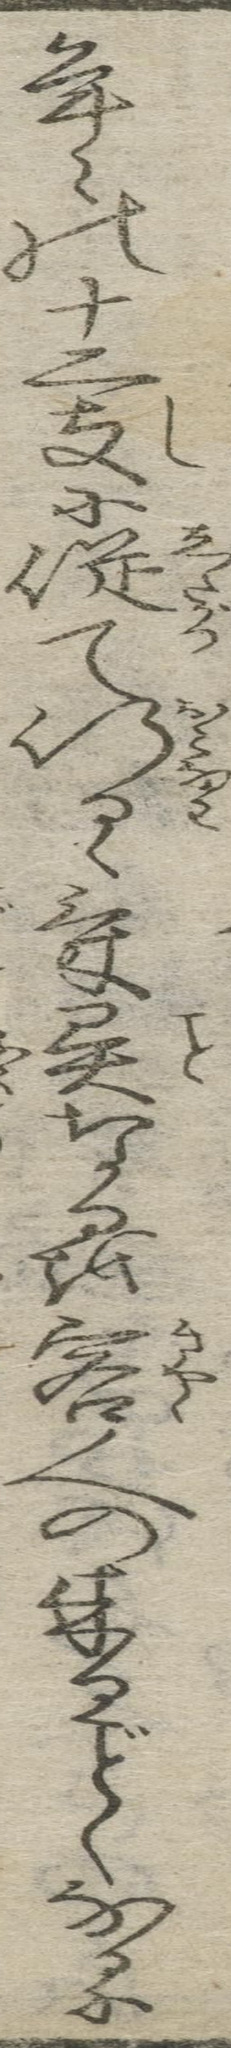年々の十二支に従て行るゝ気異なるを客人の来るごとくなるに
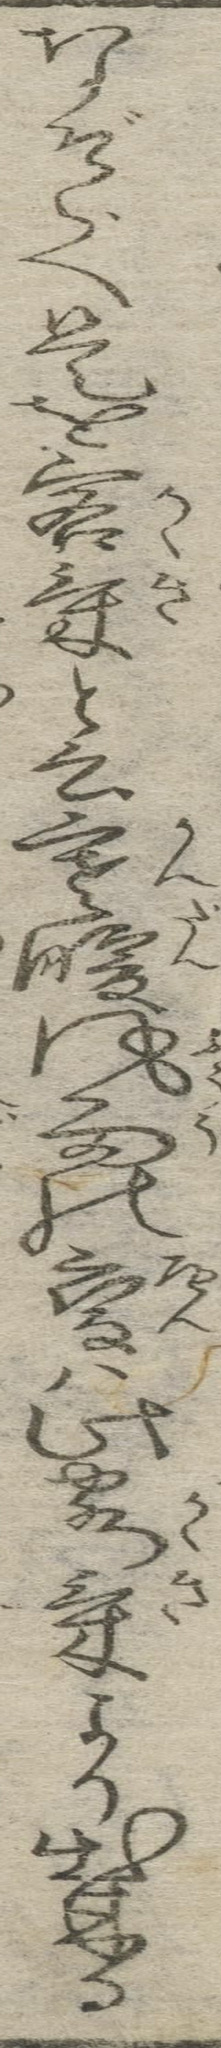なぞらへ是を客気と云寒暖風雨の変は此客気より出来る
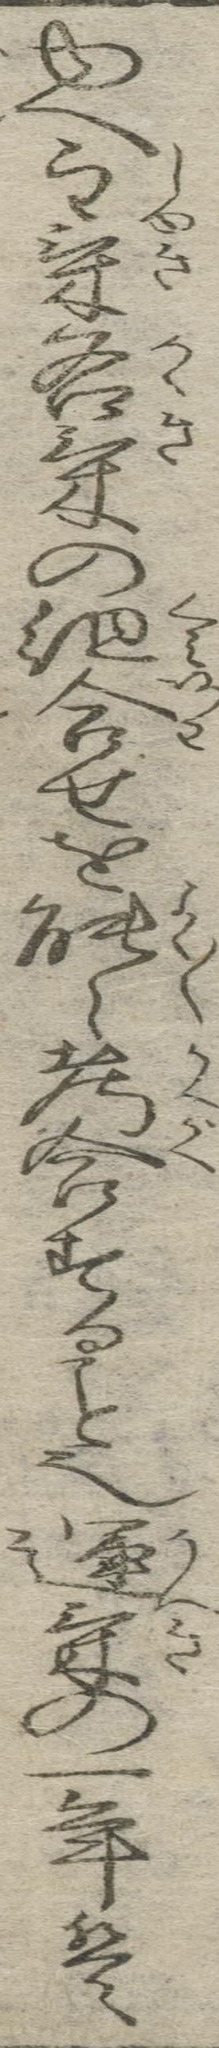ゆへ主気各気の組合せを能々考合すること也運気の一年は
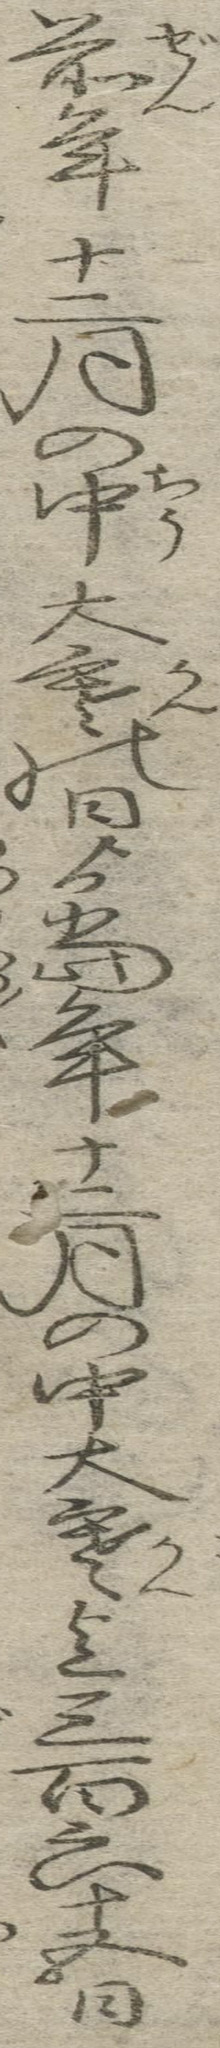前年十二月の中大寒の日ゟ当年十二月の中大寒迄三百六十五日
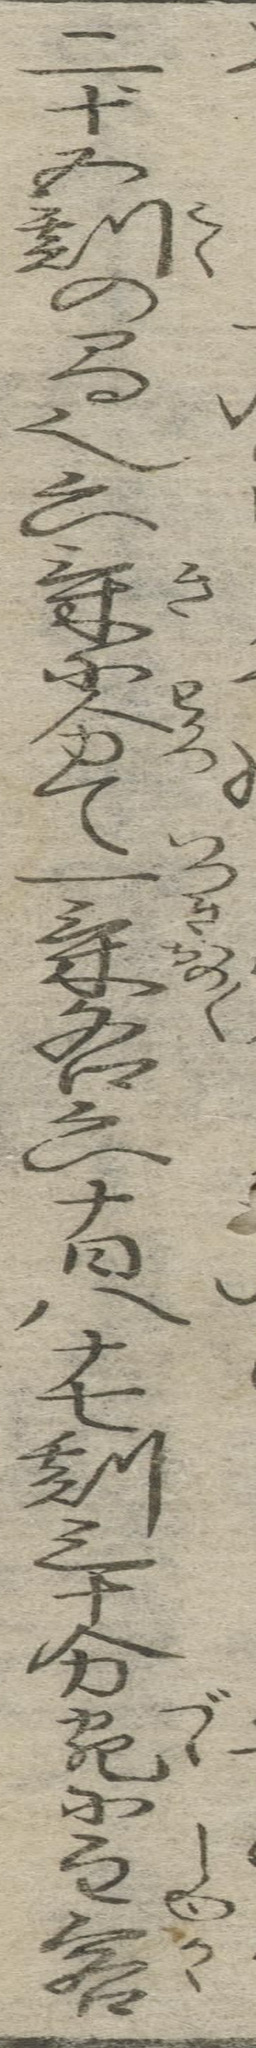二十五刻の間也六気に分て一気各六十日八十七刻三十分宛に主客

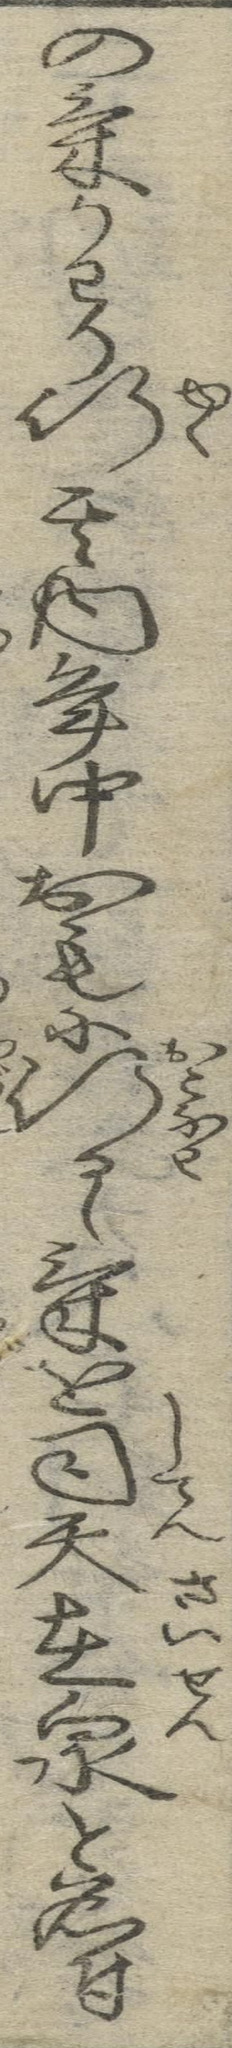の気かわり行其内年中おもに行るゝ気を司天在泉と名付
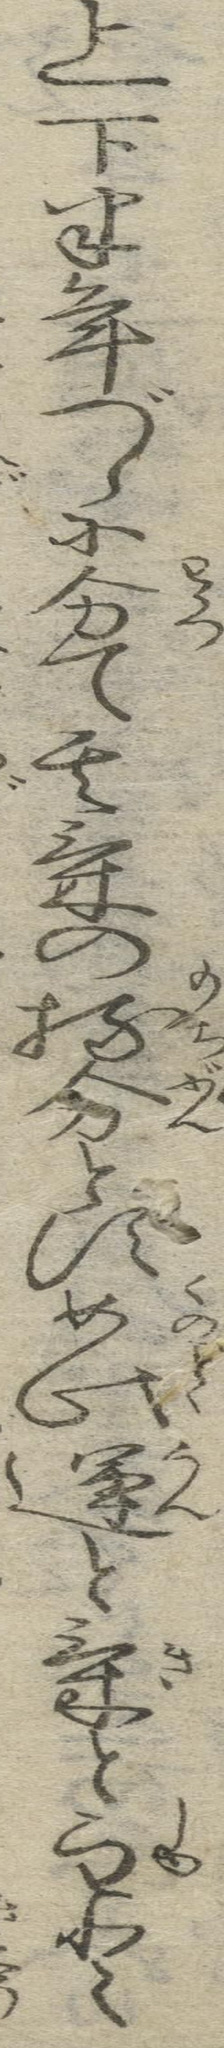上下半年づゝに分て其気の持分とす如此運と気と主と
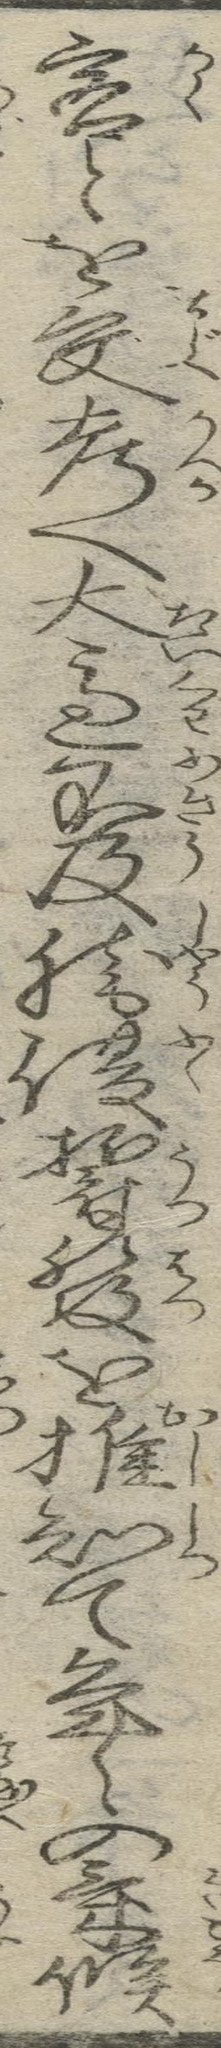客とを交考へ大過不及勝復鬱発を推知て年々の気候
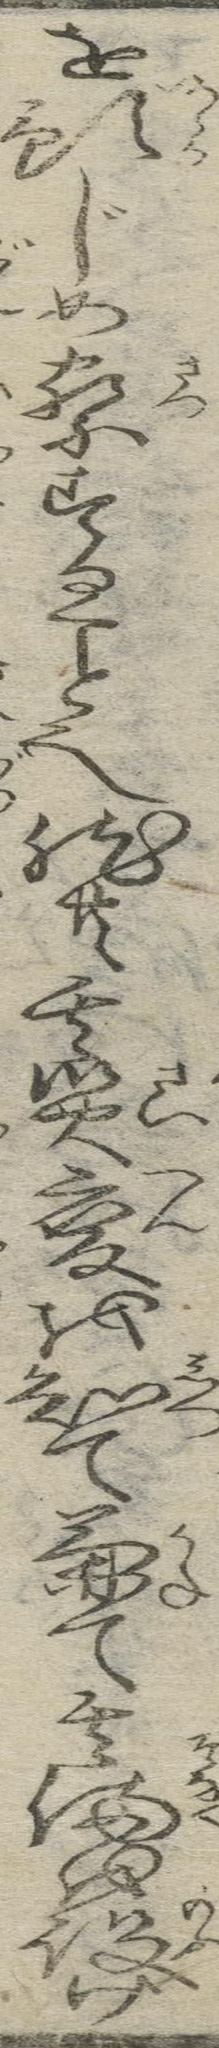を預じめ察すること也然共其災変を知て兼て其備を設け
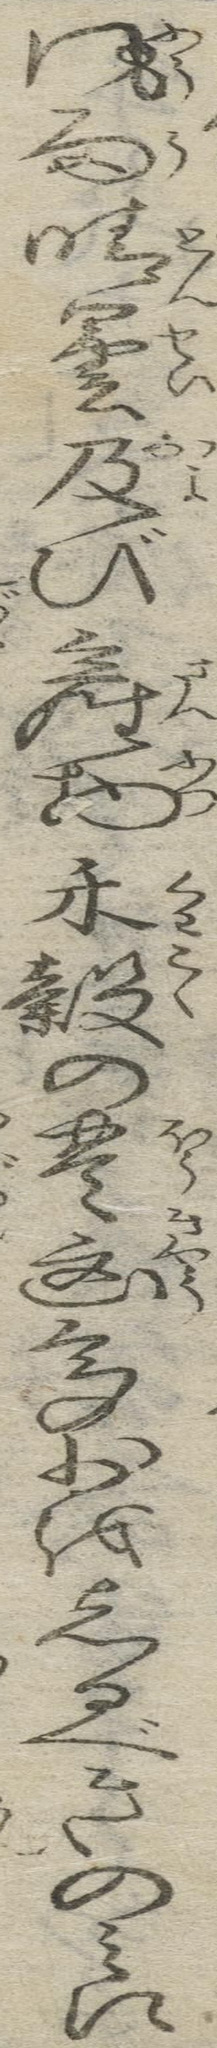風雨晴曇及び産物禾穀の豊凶多少をしるべきのみに
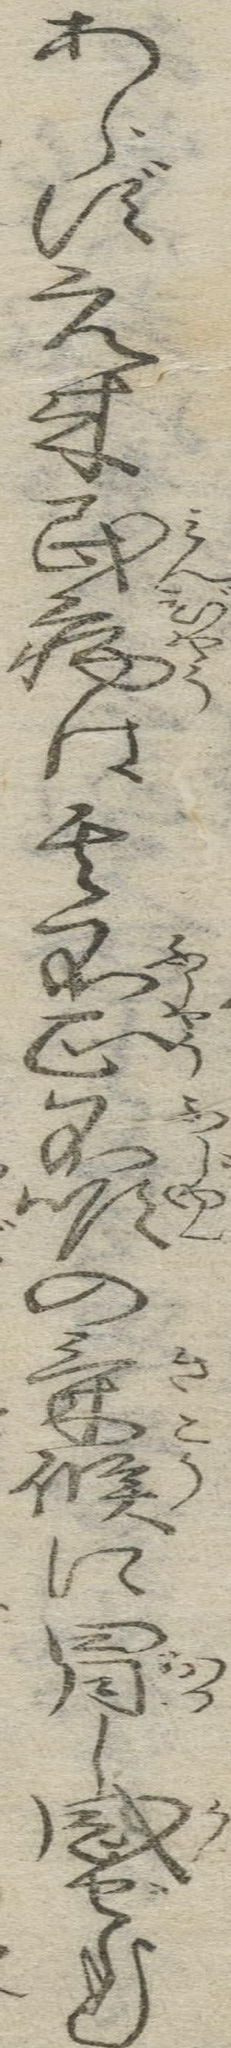あらず元来民病は其不正不順の気候に冒し感ぜ
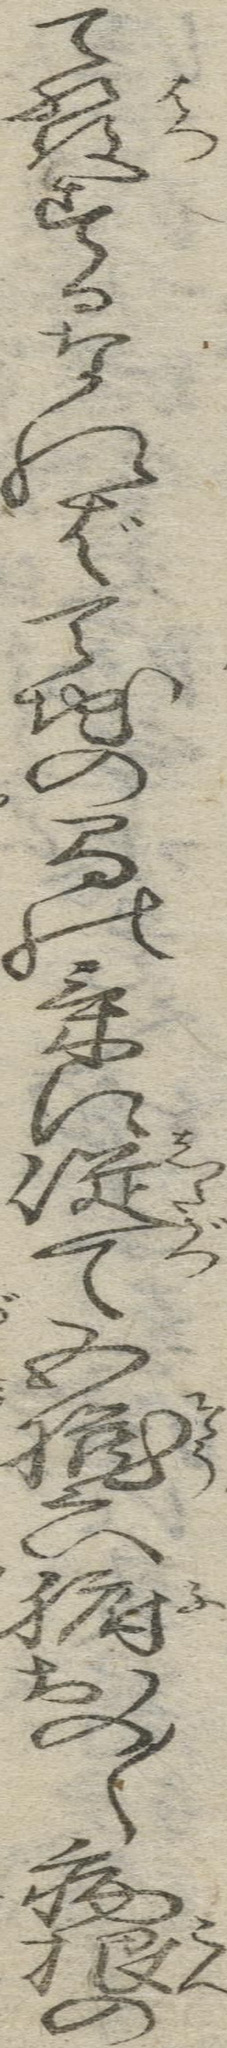て発するなれば天地の間の気に従て五臓六腑おの〳〵病根の
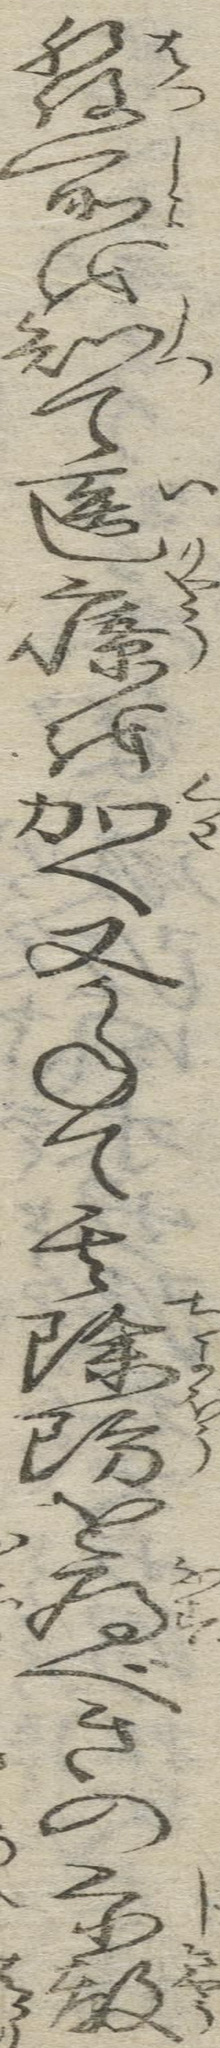発所を知て医療を加へ又かねて其除防を為べきの示教
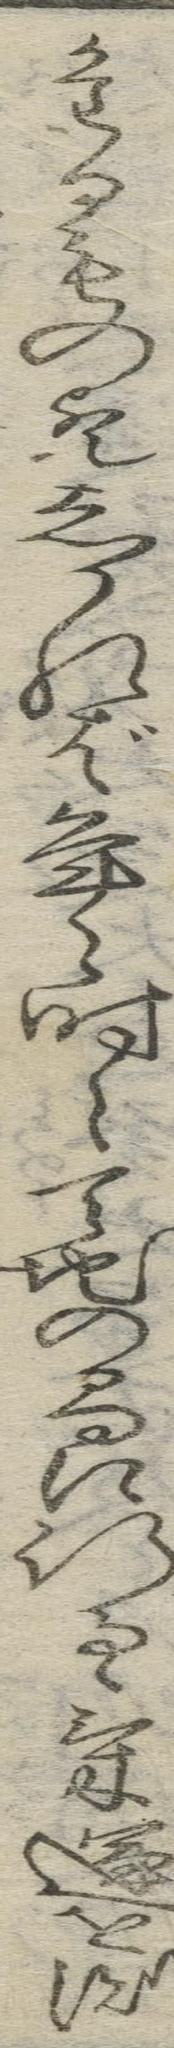たるものそしかれば年々時々天地の間に行るゝ気運を測
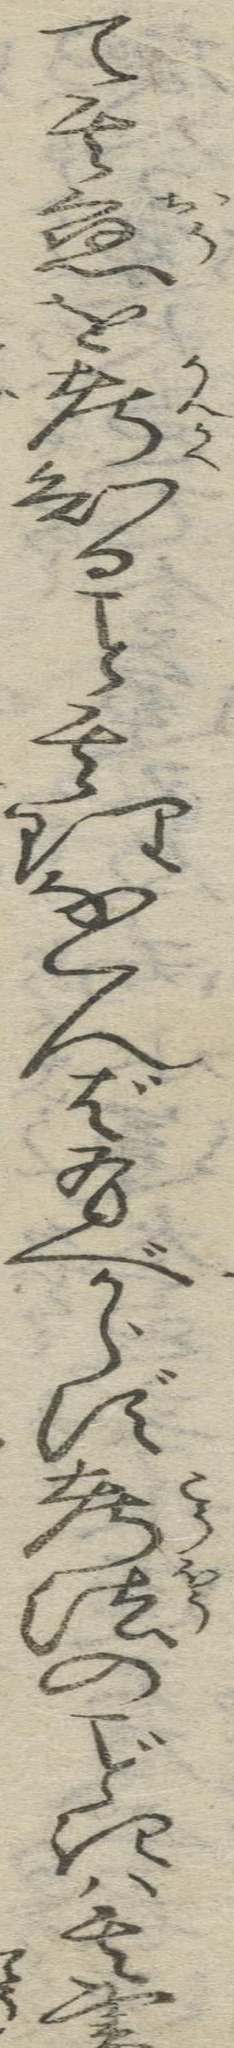て其応を考知ること其理なくんば有べからず考方のごときは其書
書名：訓蒙天地辨　天
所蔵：東京大学地震研究所図書室 Earthquake Research Institute Library, The University of Tokyo, JAPAN
